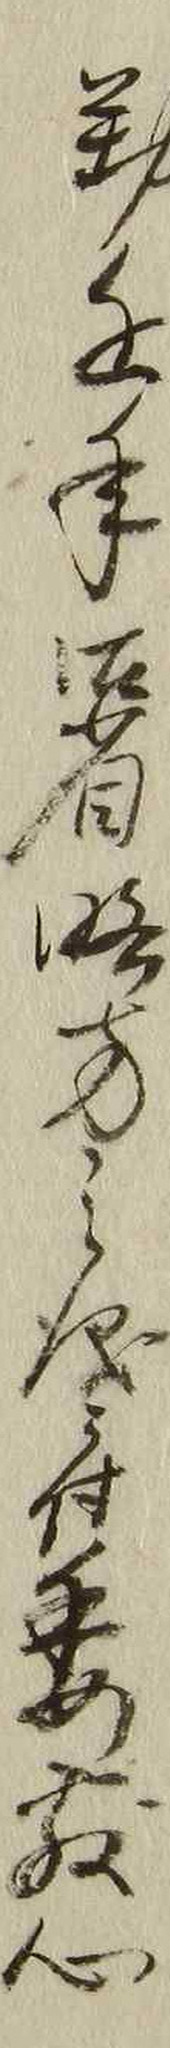勤近年御省略方之儀ニ付委敷心
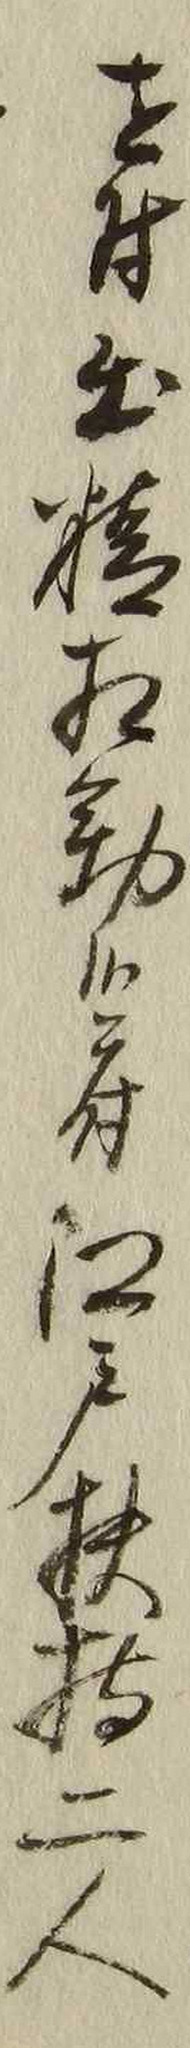を付出精相勤候ニ付江戸扶持二人
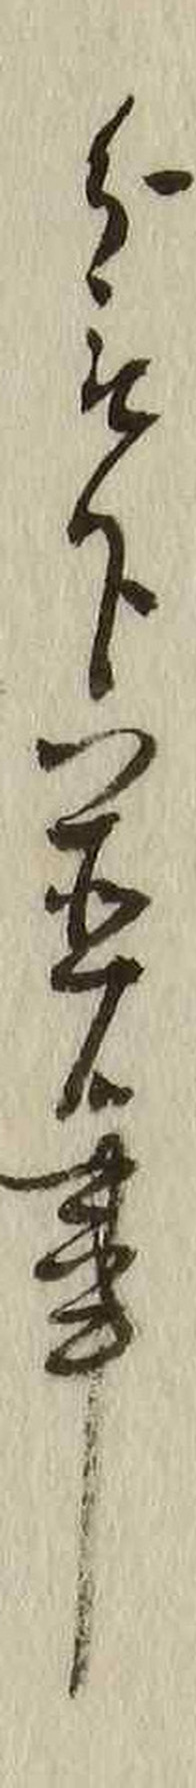分被下置候事
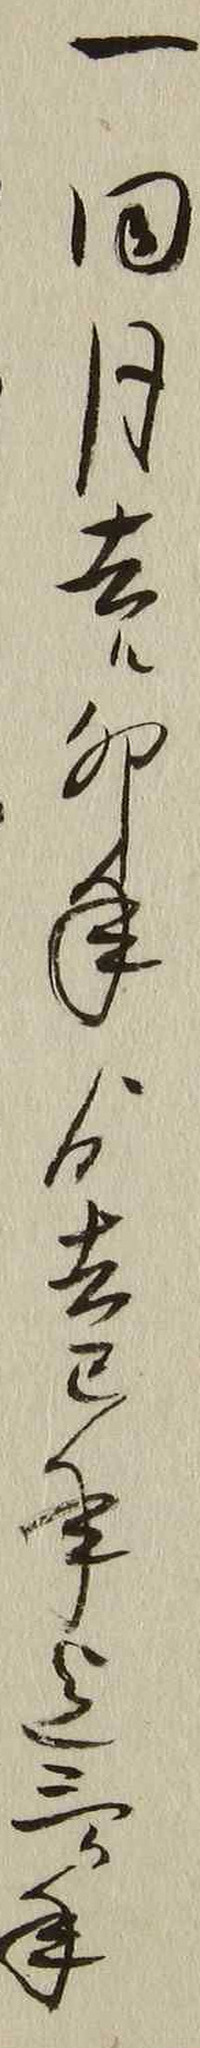一同月去ル卯年ゟ去巳年迄三ケ年
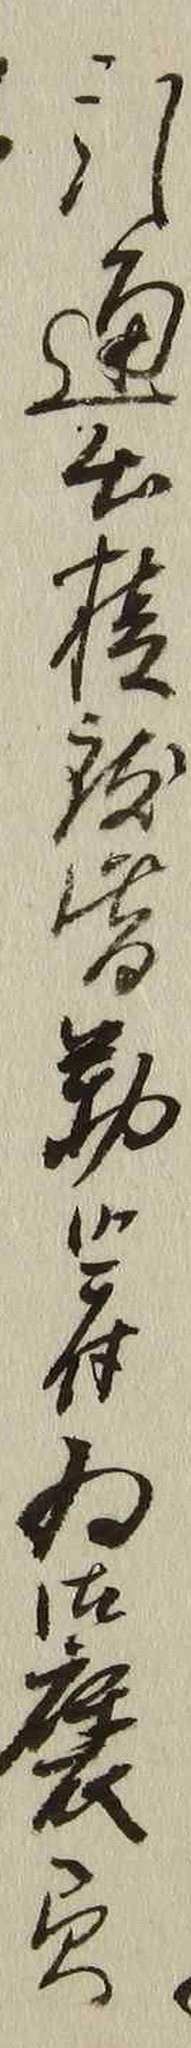引通出精致皆勤候ニ付為御褒美
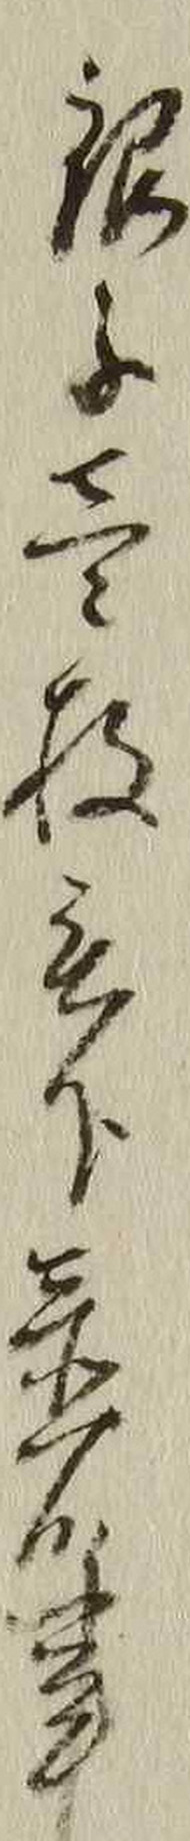銀子壱枚被下置候事
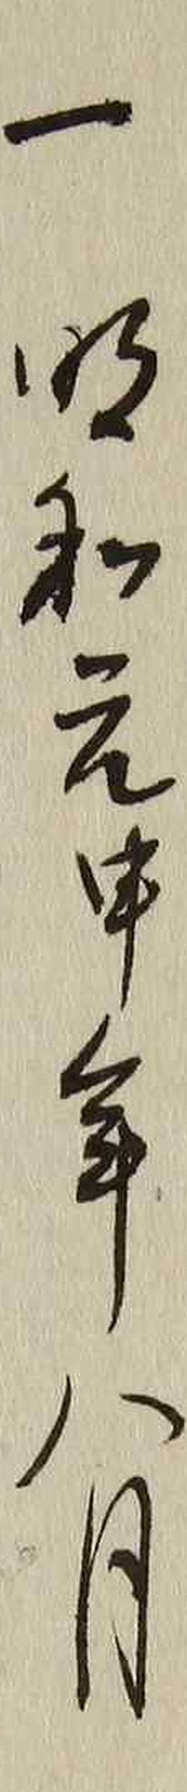一明和元申年八月
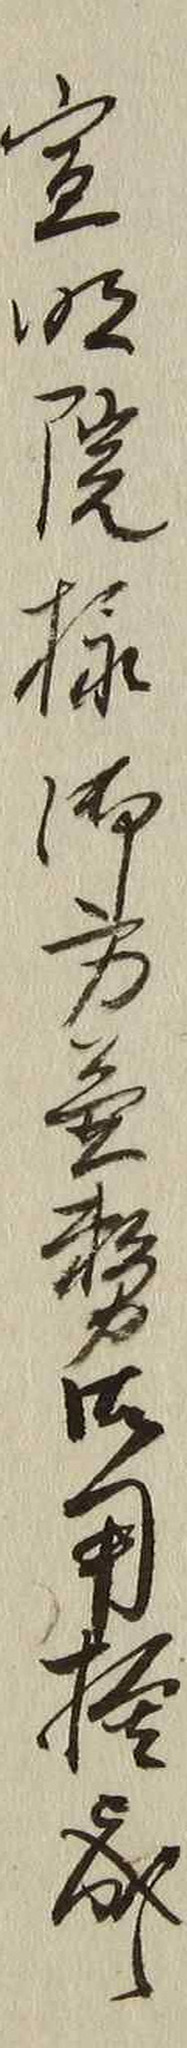宣明院様御方兼務御用捨被成候
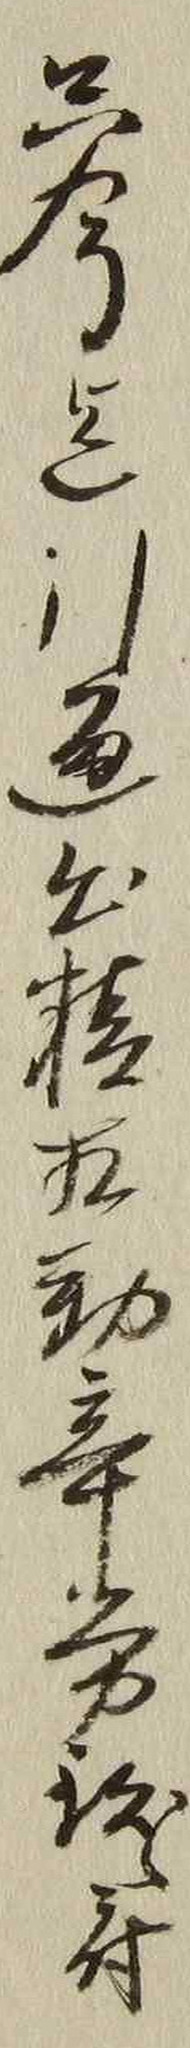只今迄引通出精相勤辛労致候ニ付
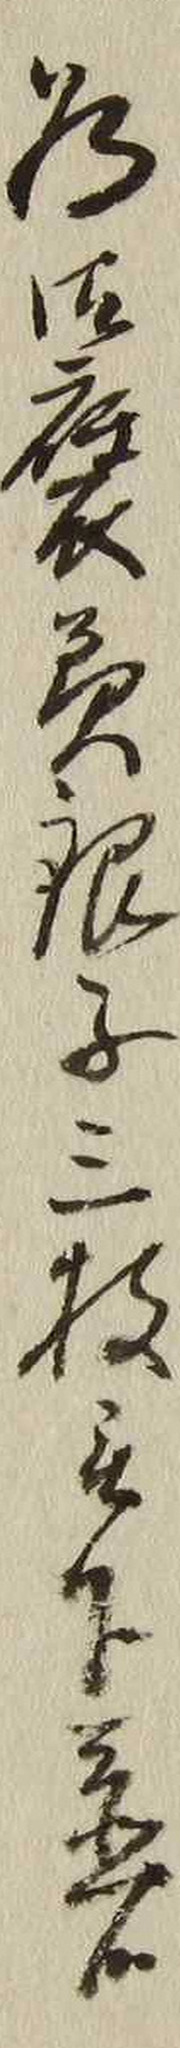為御褒美銀子三枚被下置候
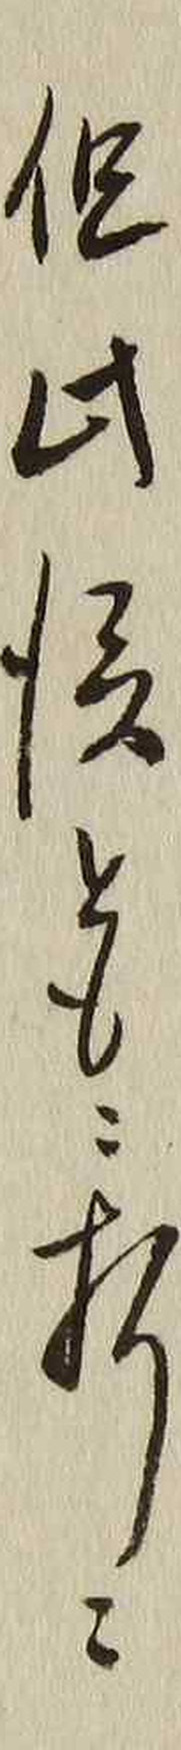但此後ともニ折々
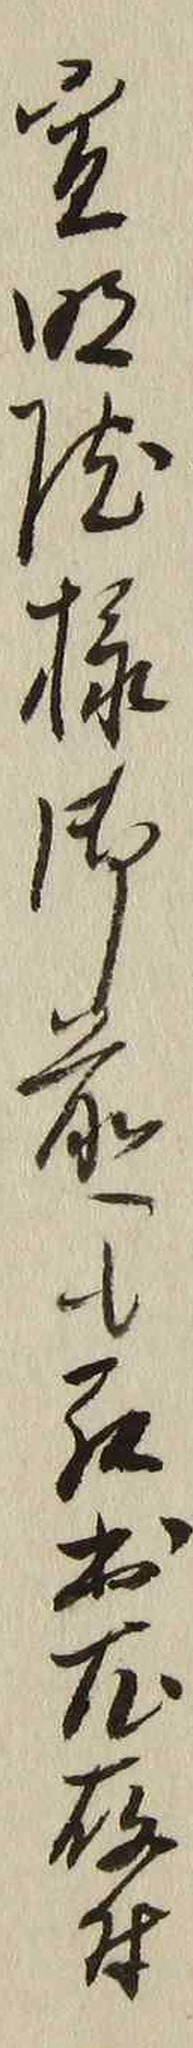宣明院様御前へも罷出尤存付
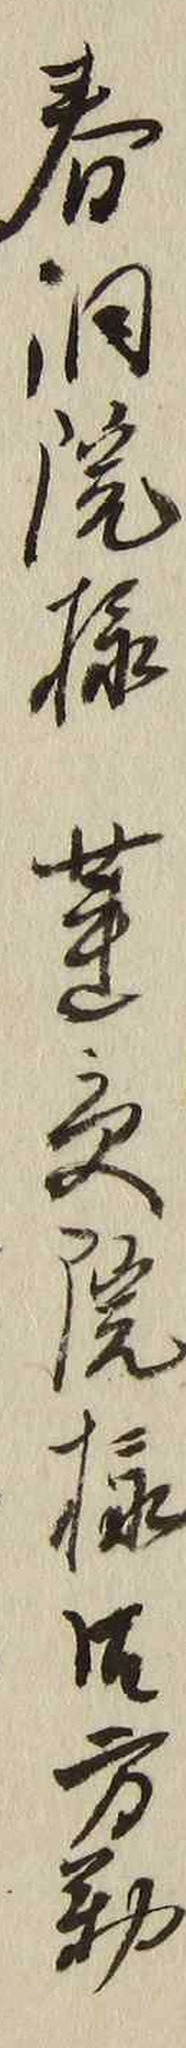春洞院様蓮受院様御方勤
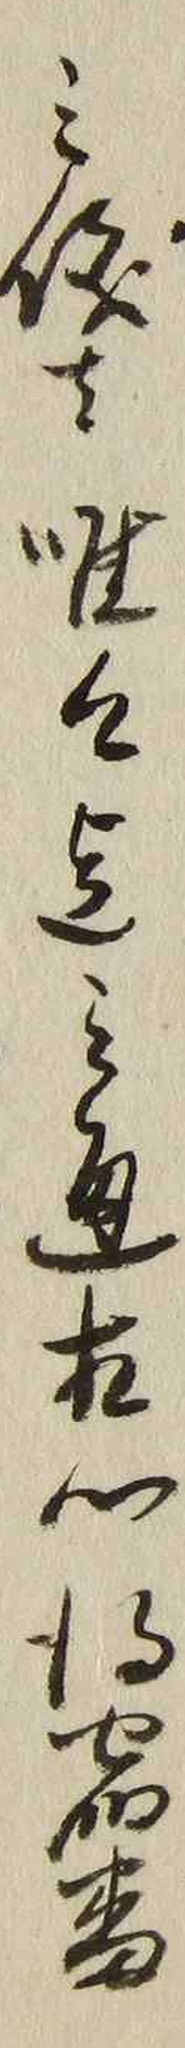之儀者唯今迄通相心得宿番
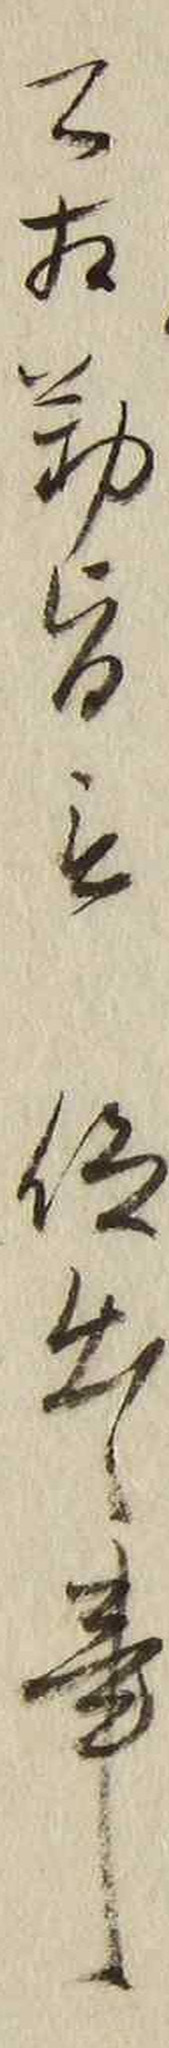可相勤旨被仰出候事

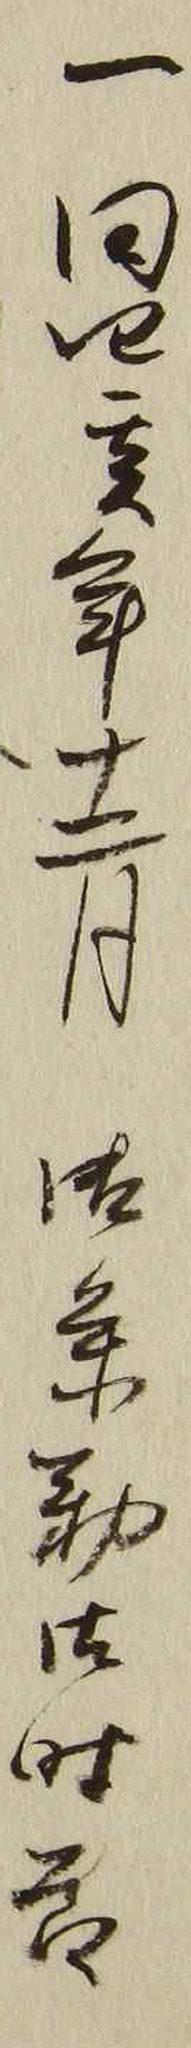一同四亥年十二月御参勤御時節
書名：諸士系譜　巻之349　も之部5
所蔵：会津若松市立会津図書館
